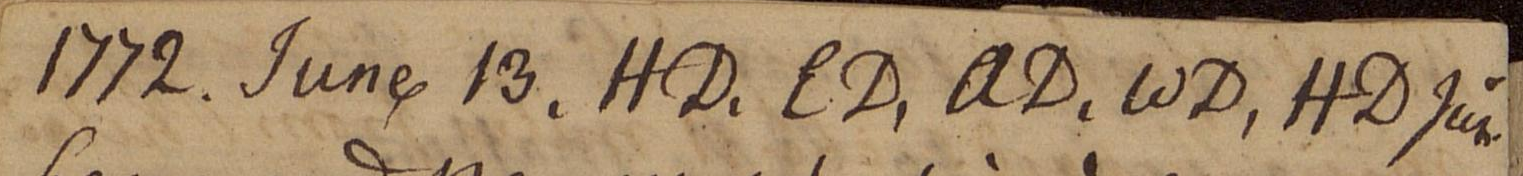1772. June 13. HD. ED, AD. WD, HD Jun^r
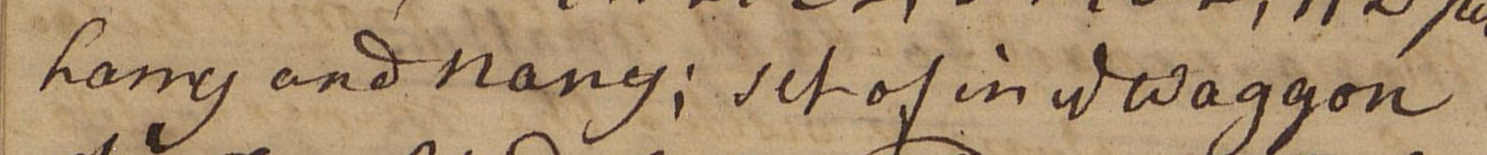harry and Nany; set of in y^e Waggon
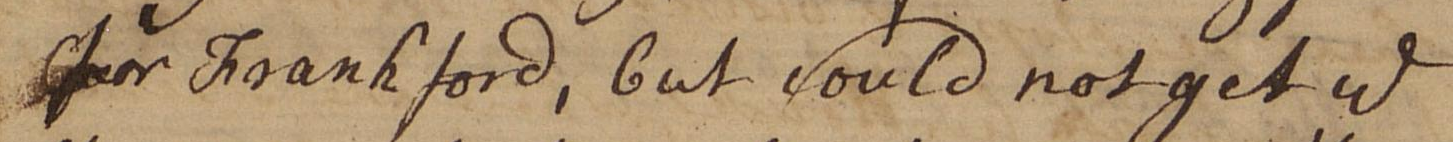for Frankford, but could not get y^e
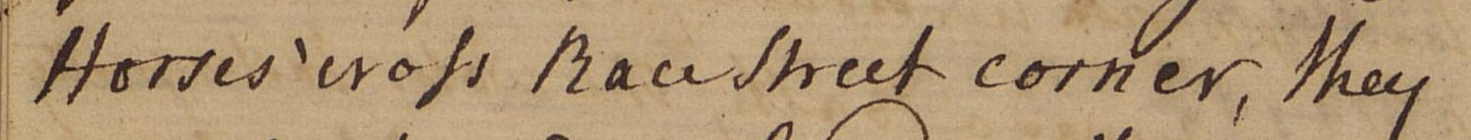Horses ' cross Race Street corner, they
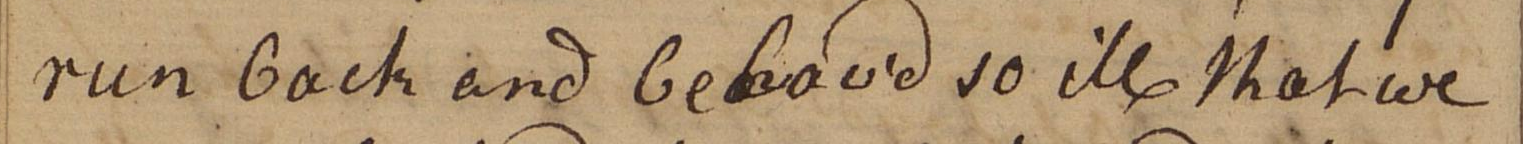run back and behav'd so ill that we
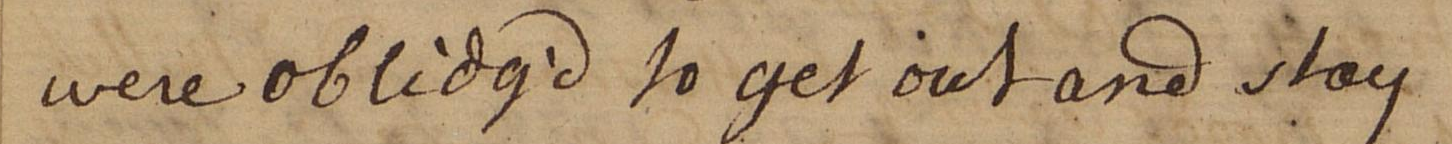were oblidg'd to get out and stay
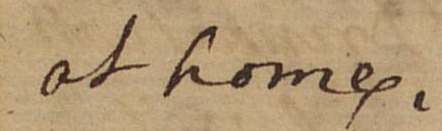at home,
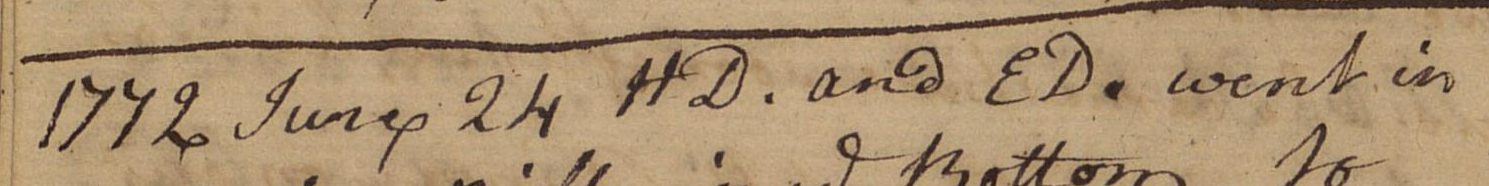1772 June 24 HD. and ED. went in
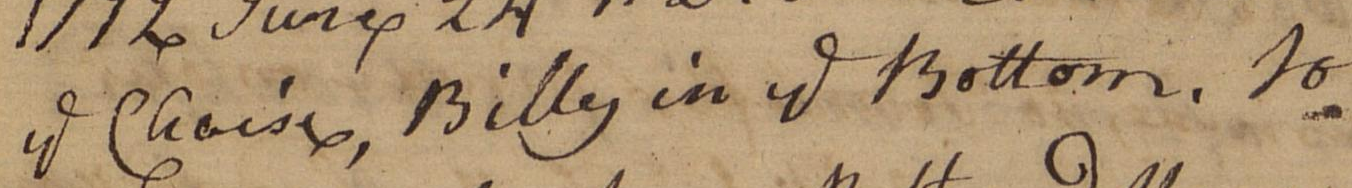y^e chaise, Billy in y^e Bottom. to
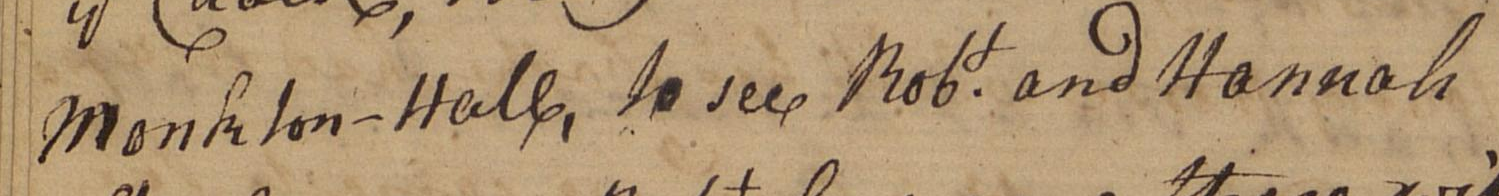Monkton-Hall, to see Rob^t. and Hannah
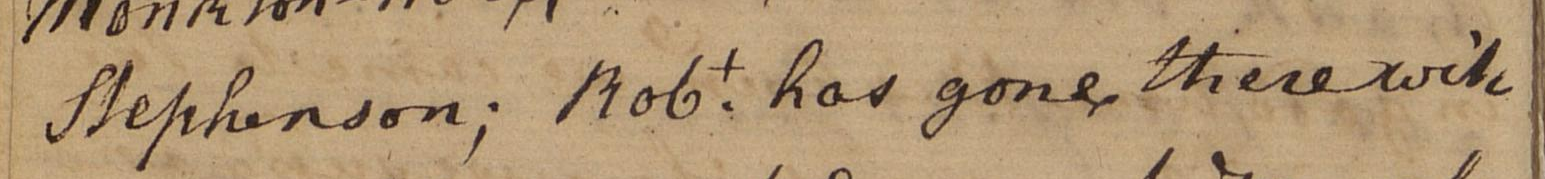Stephenson; Rob^t. has gone there wih
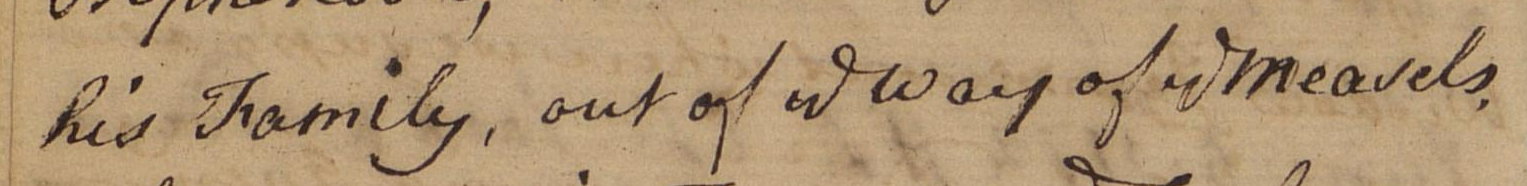his Family, out of y^e way of y^e measels,
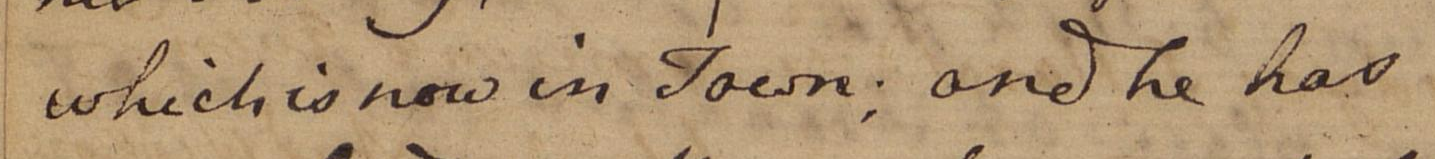which is now in Town; and he has
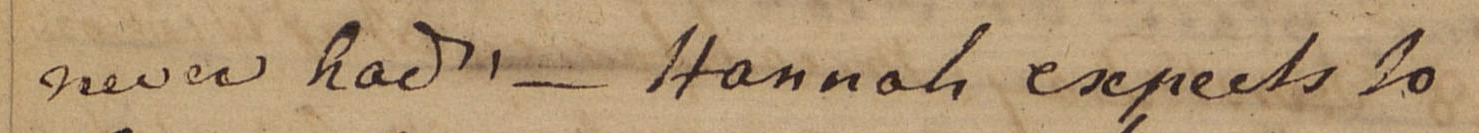never had- Hannah expects to
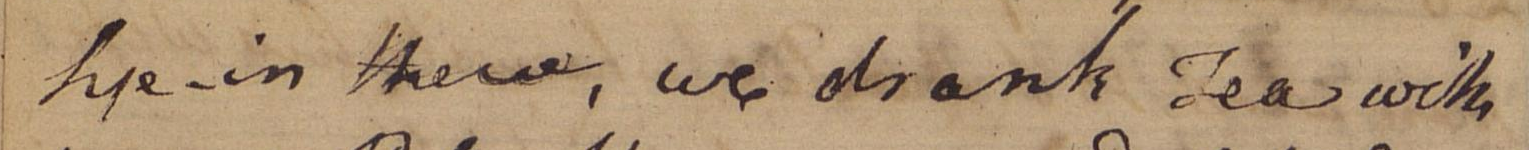Lye-in there, we drank Tea with
